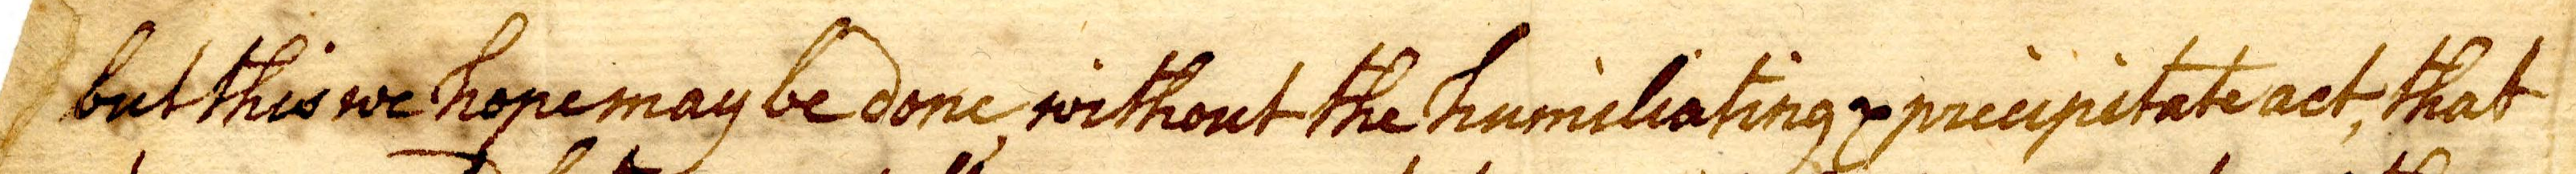but this we hope may be done, without the humiliating & precipitate act, that
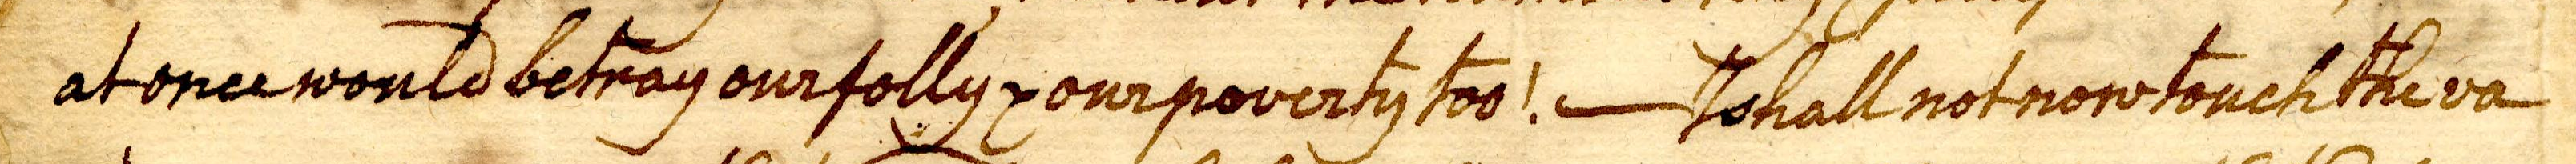at once would betray our folly & our poverty too!- I shall not now touch the va
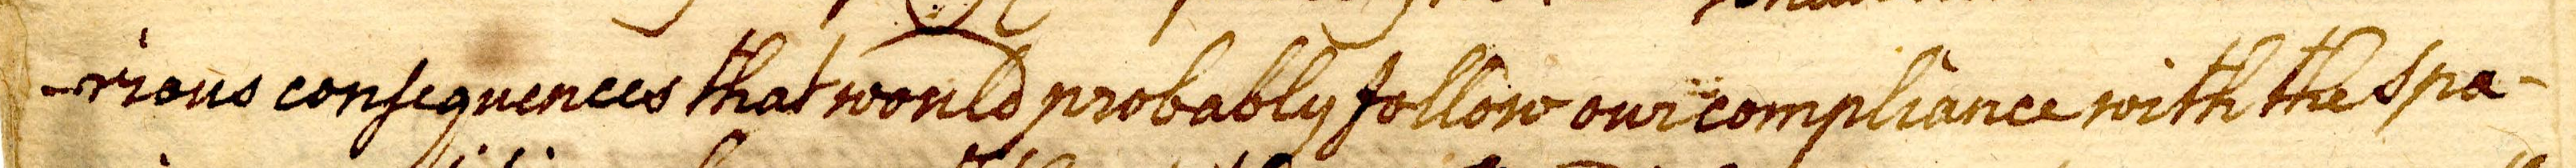-rious consequences that would probably follow our compliance with the spa-
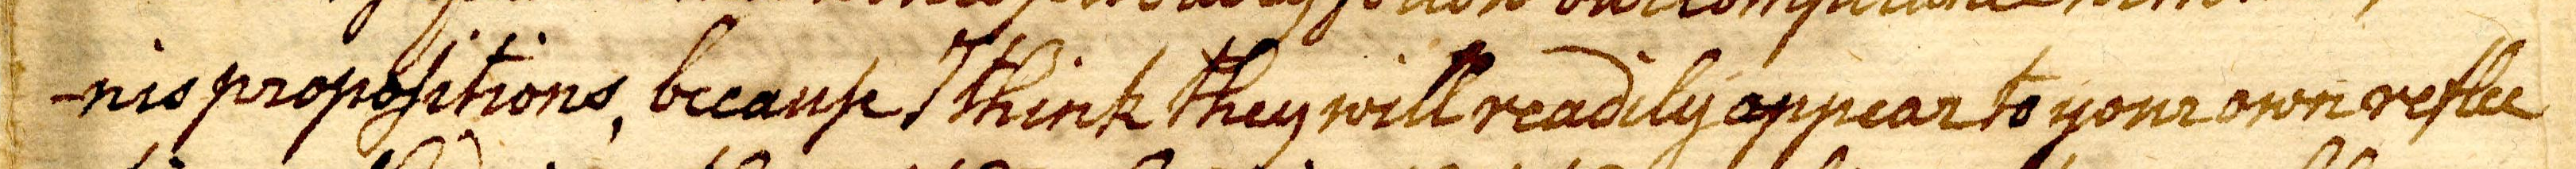nis propositions, because I think they will readily appear to your own reflec
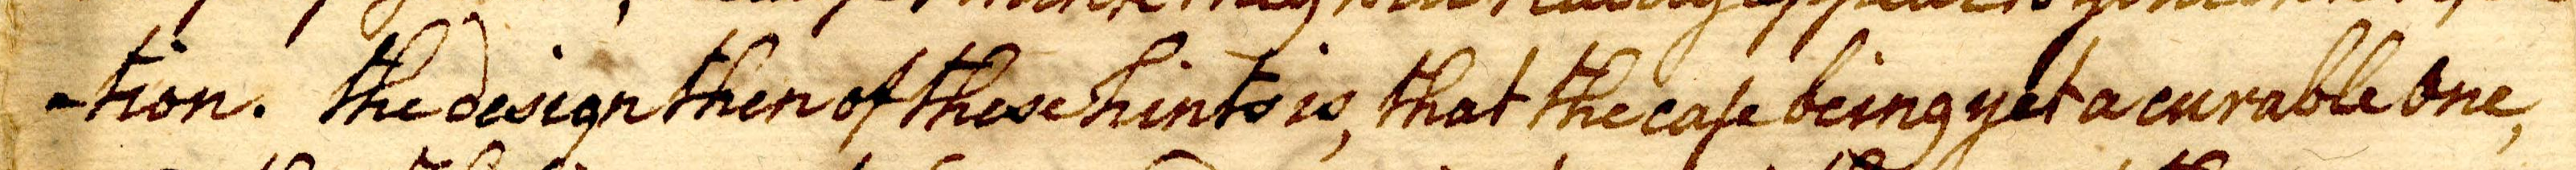-tion. the design then of these hints is, that the case being yet a curable one,
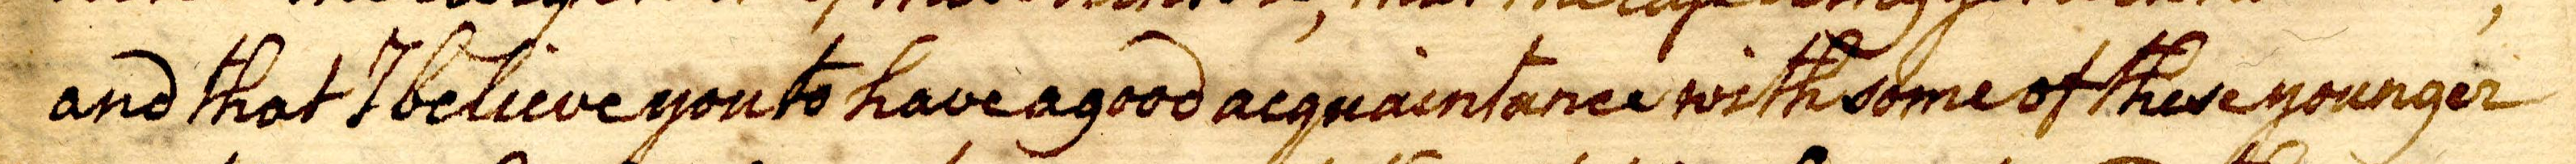and that I believe you to have a good acquaintance with some of these younger
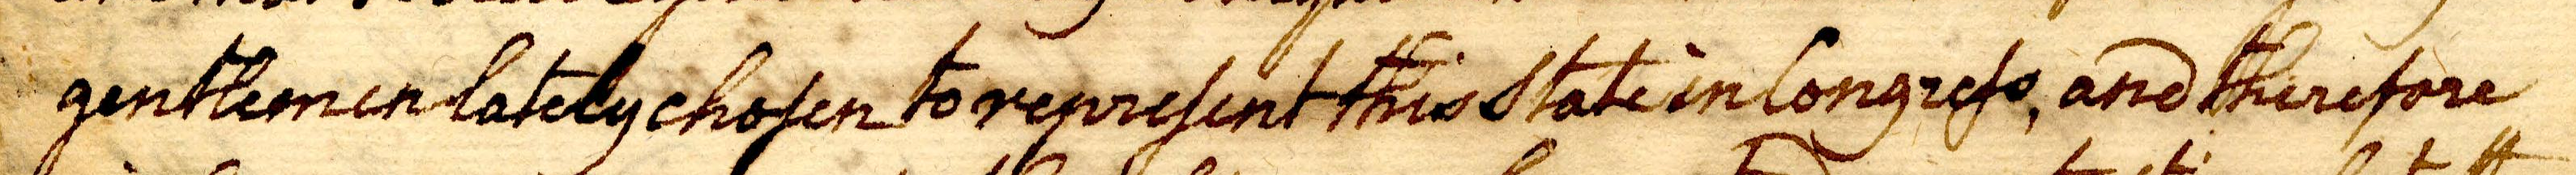gentlemen lately chosen to represent this state in Congress, and therefore
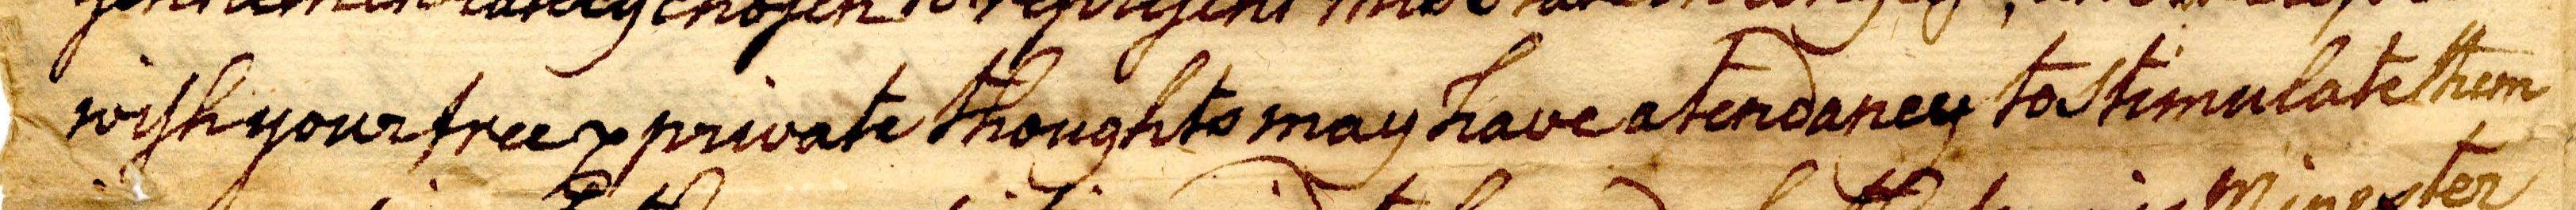wish your free & private thoughts may have a tendancy to stimulate them
